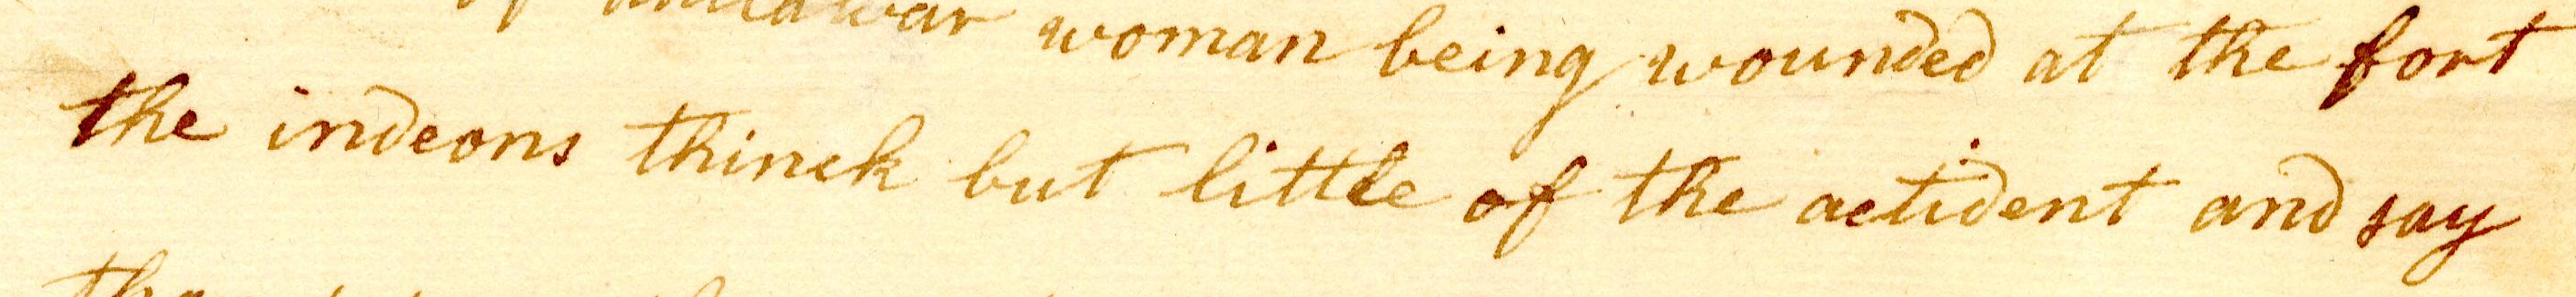the indeons thinck but little of the actident and say
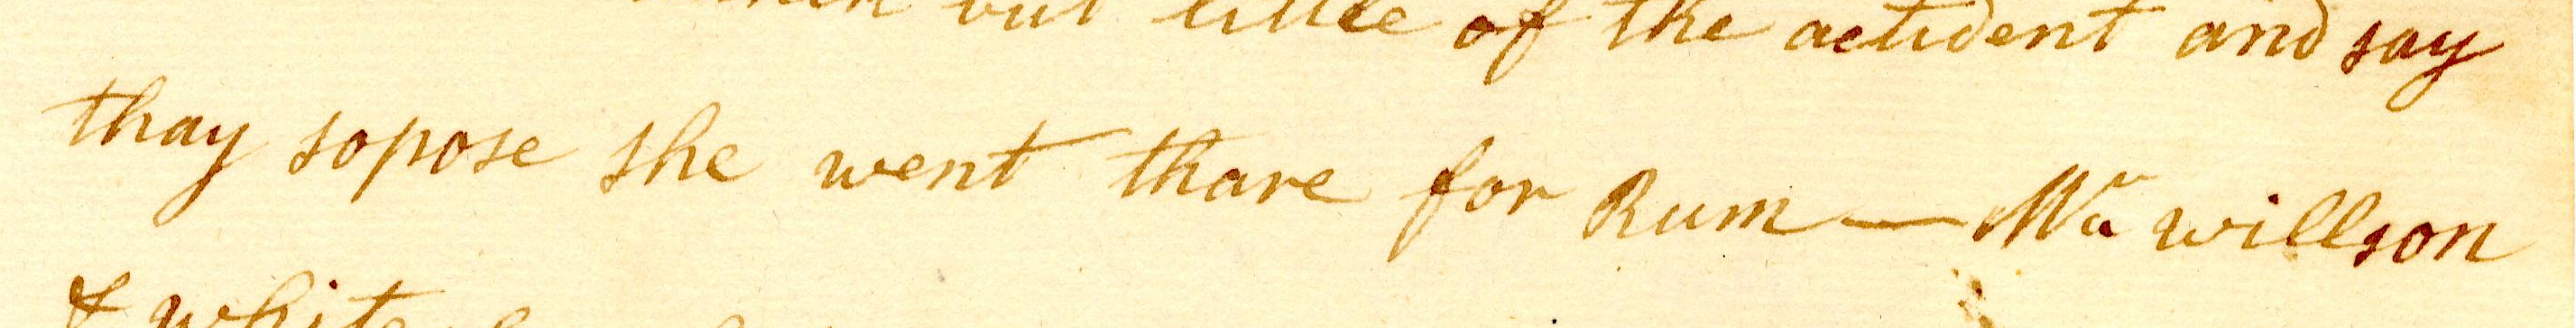thay sopose she went thare for Rum- M^r Willson
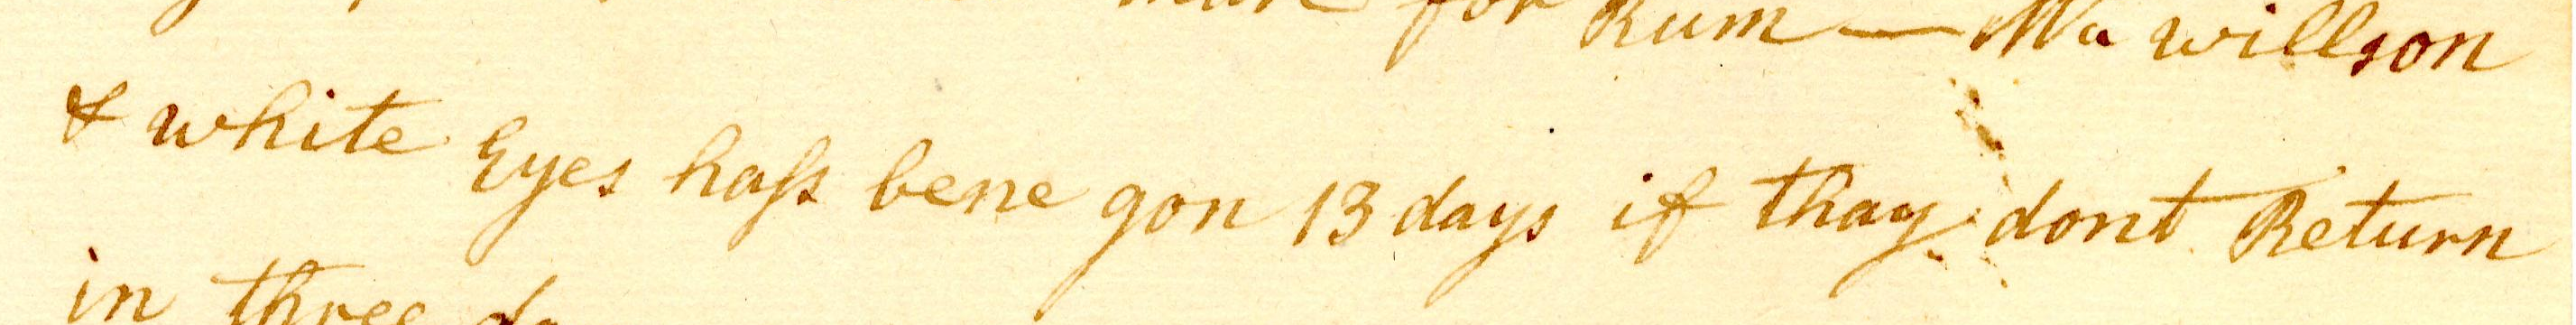& white Eyes hass bene gon 13 days if thay dont Return
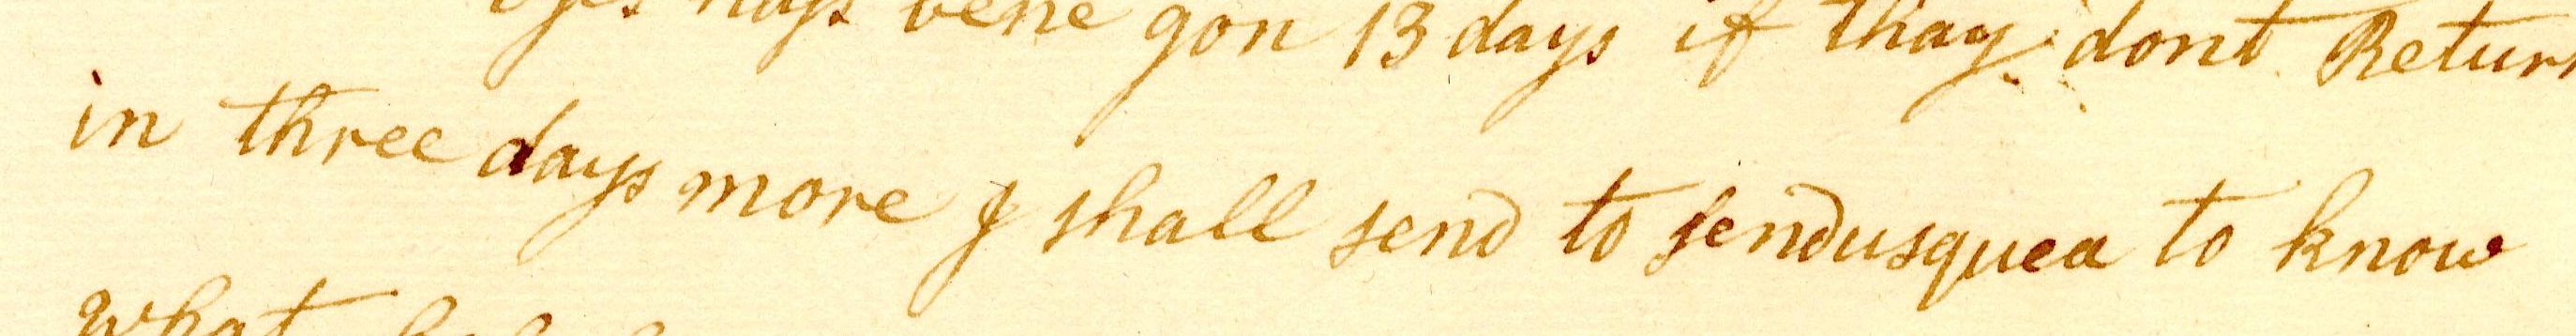in three days more I shall send to sendusquea to know
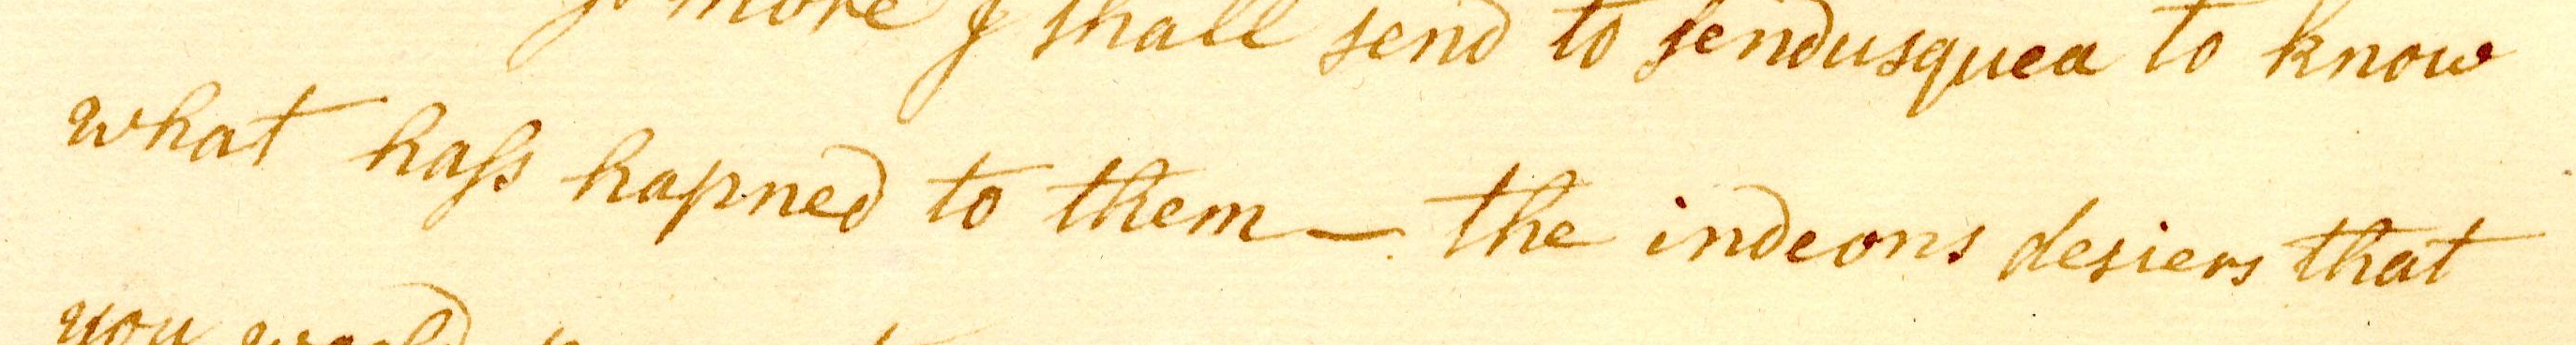what hass hapned to them- the indeons desiers that
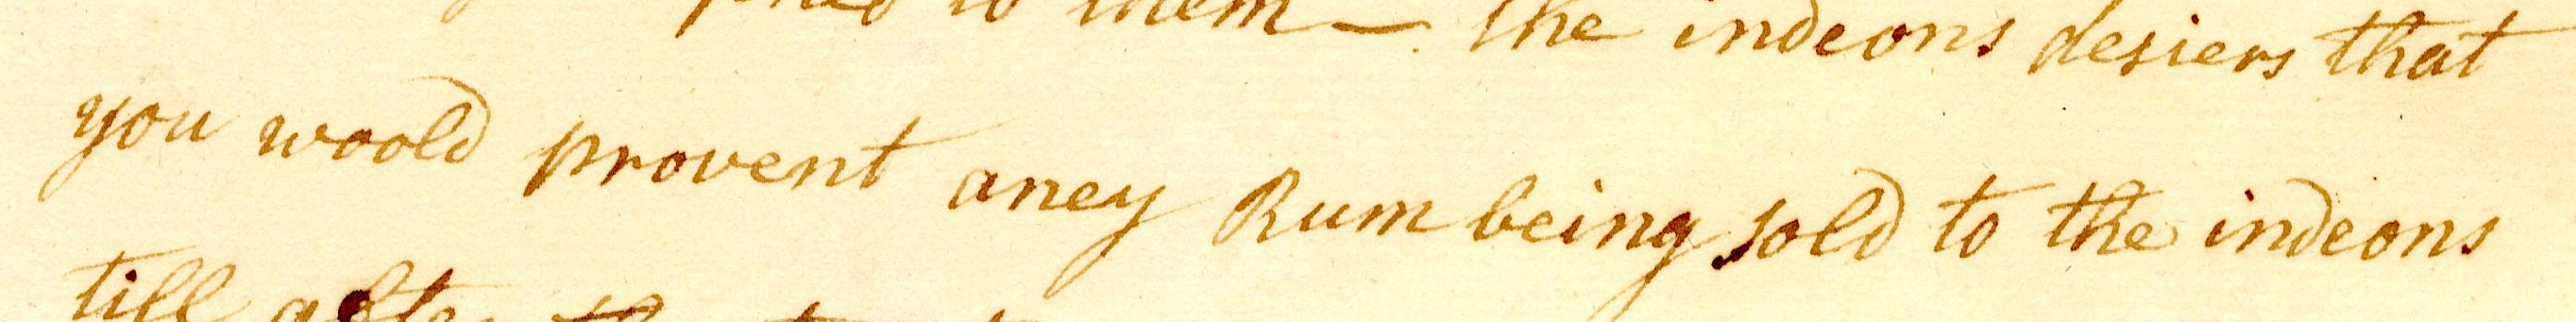you woold provent aney Rum being sold to the indeons
